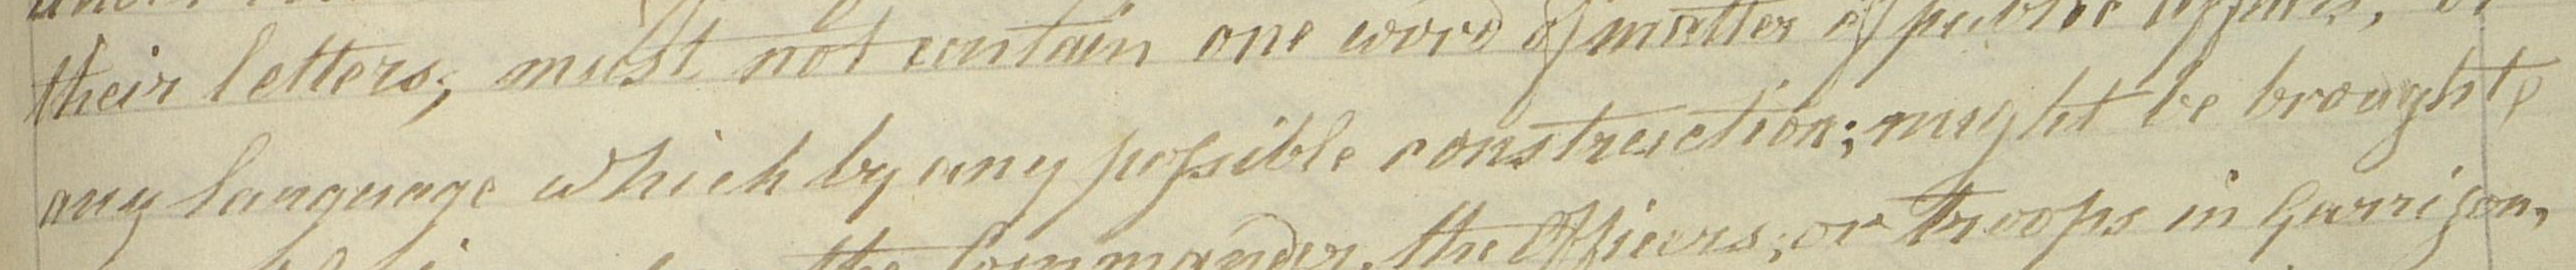any Language which by any possible construction; might be brought
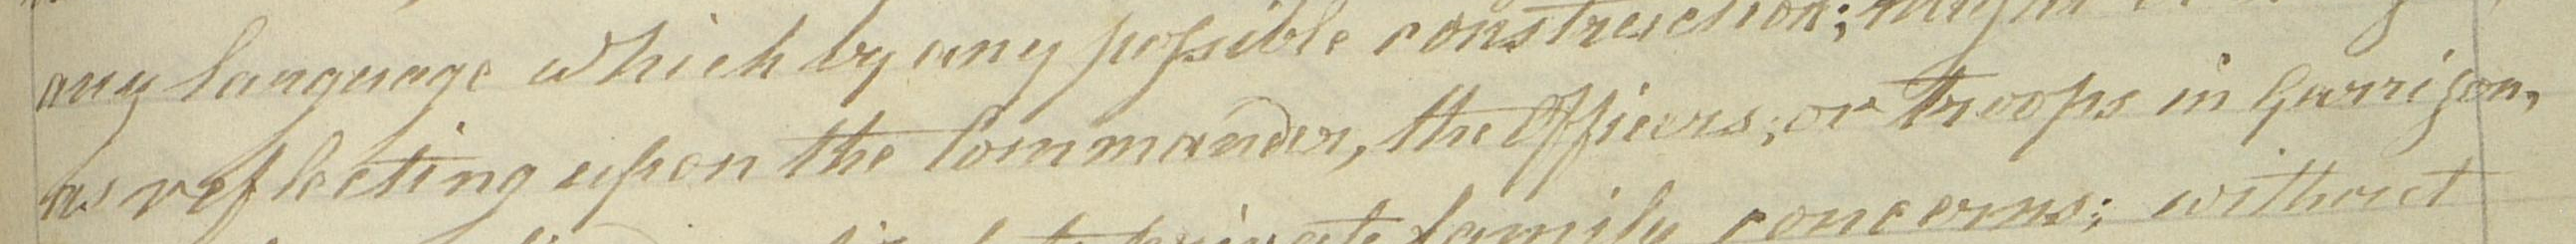how reflecting upon the Commander, the Officers; or Troops in Garrison,
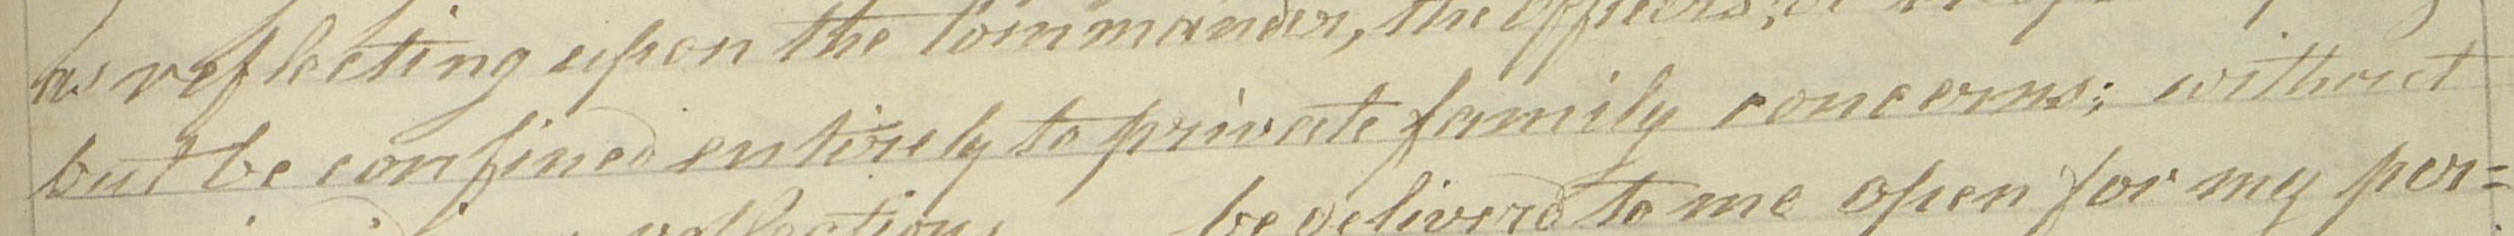but be confined entirely to private family concerns; without
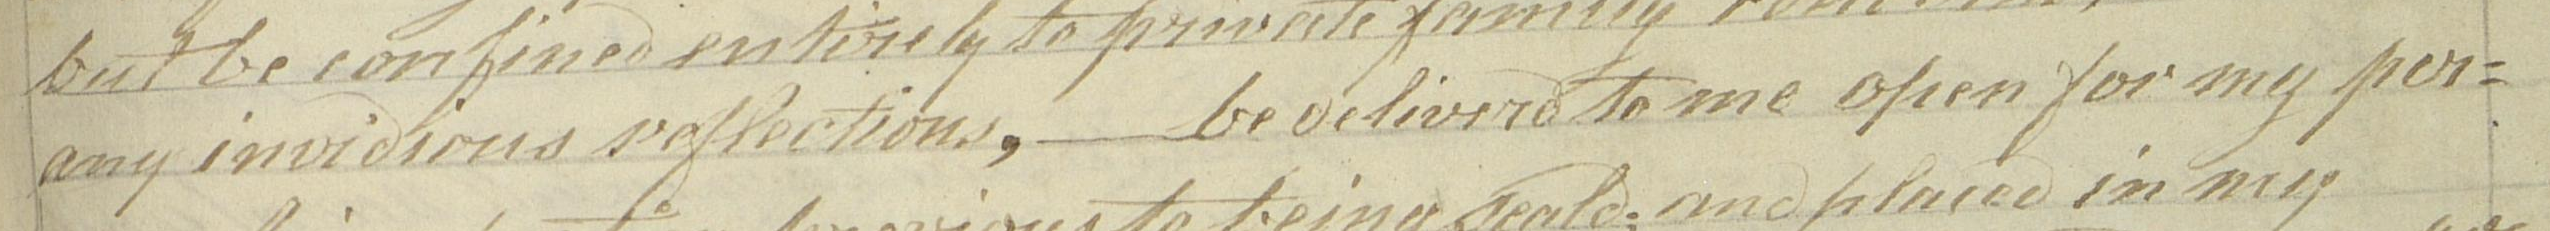any invidious reflections, be deliverd to me open for my per-
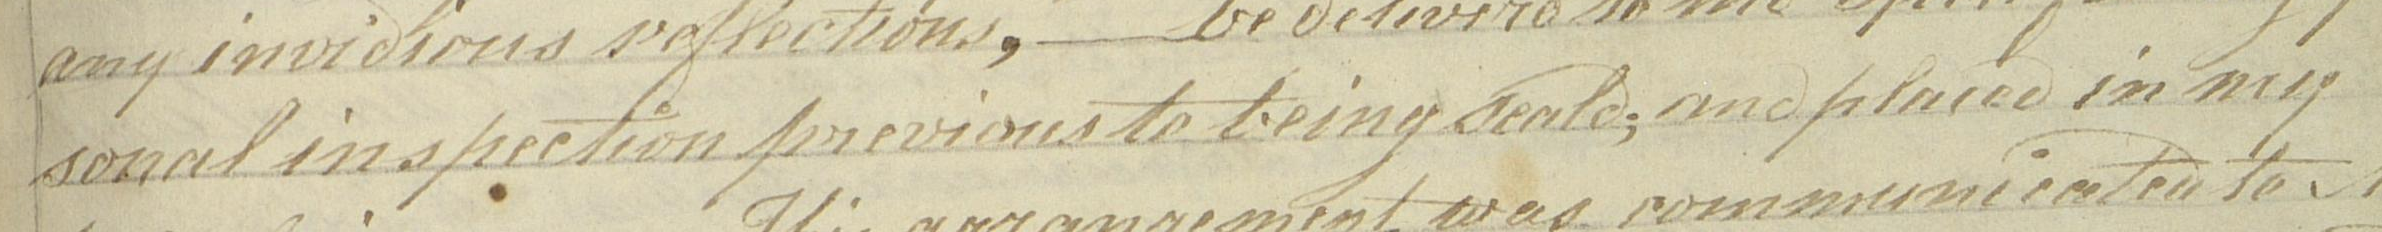sonal inspection previous to being seald, and placed in my
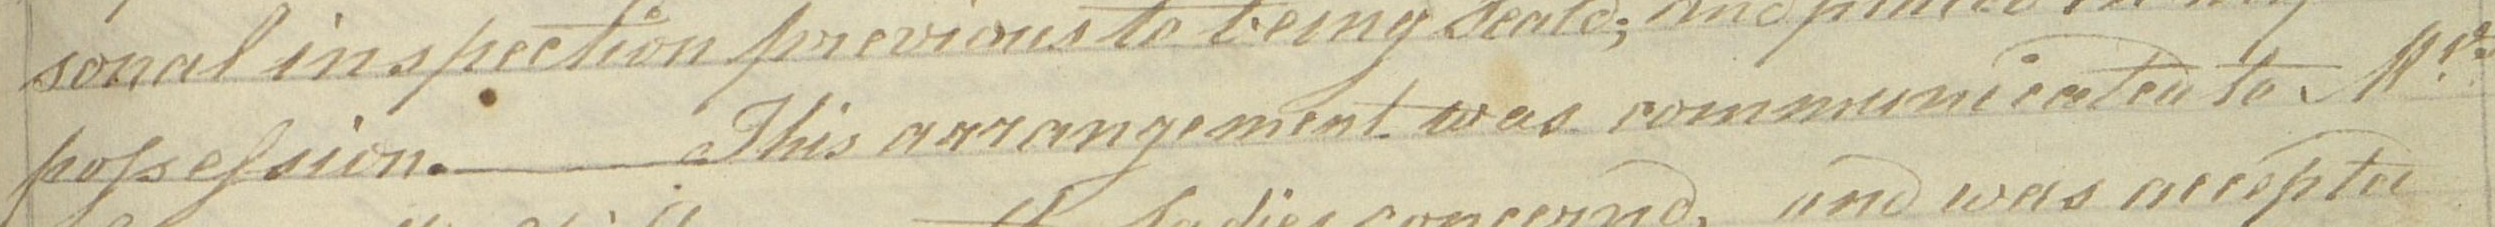possession. This arrangement was communicated to M^rs.
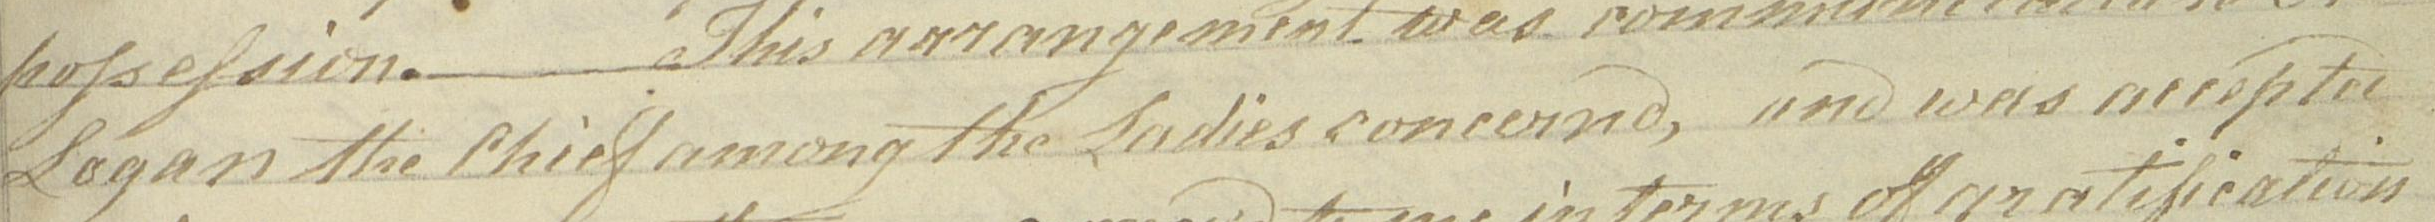Logan the Chief among the Ladies concernd, and was accepted
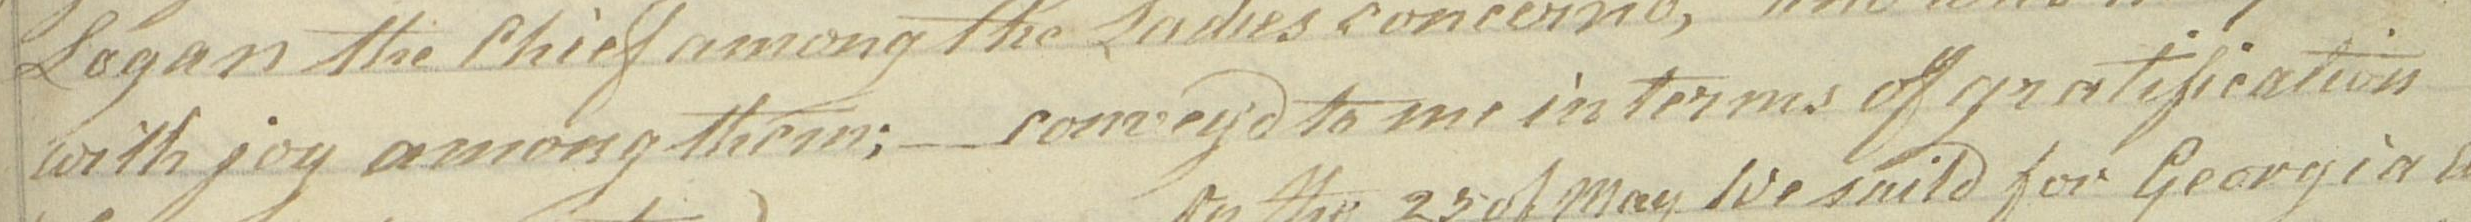with joy among them; convey'd to me in terms of gratification
